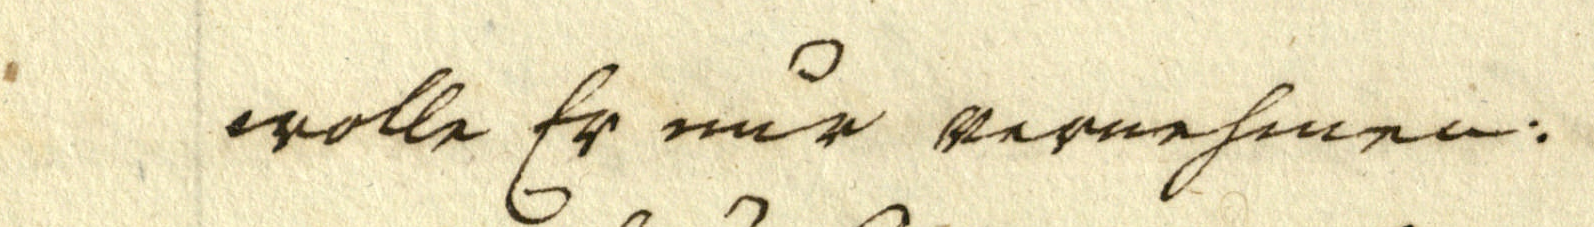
wolle Er nur vernehmen:
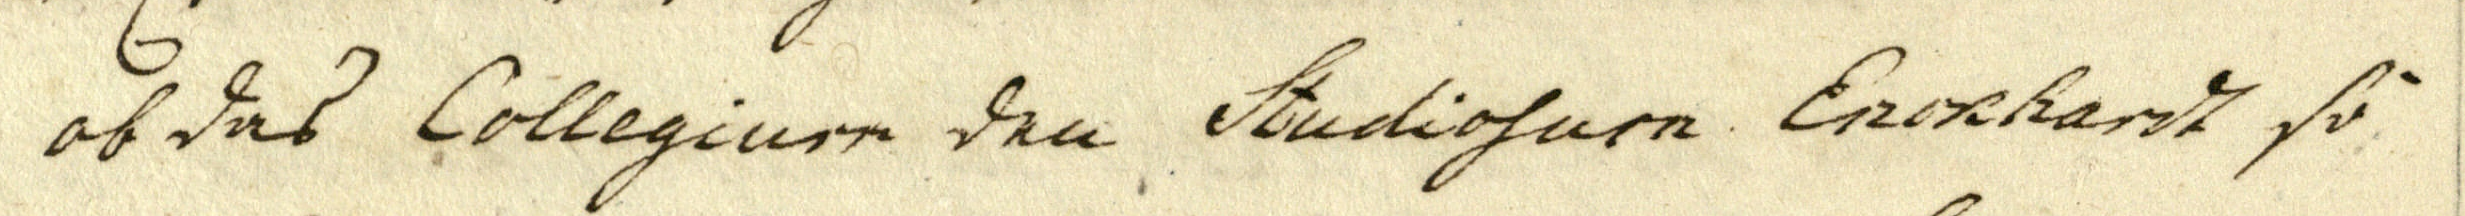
ob das Collegium den Studiosum Enckhardt so
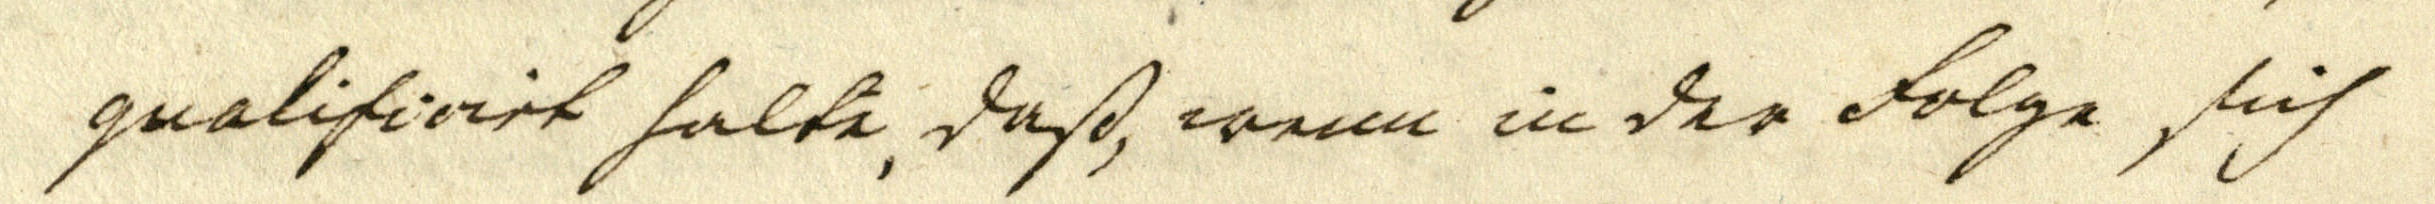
qualificirt halte, daß, wenn in der Folge sich
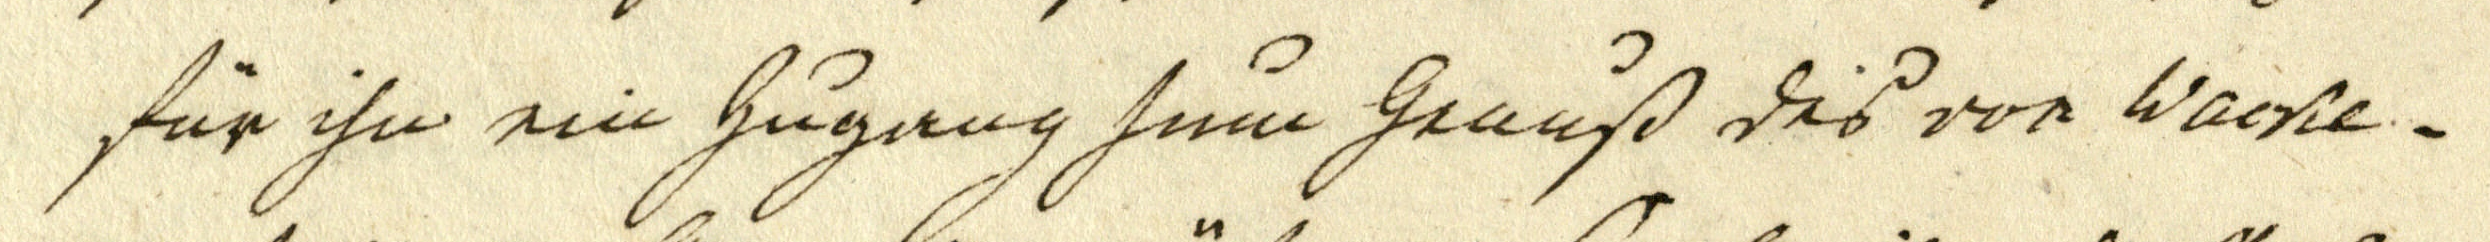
für ihn ein Zugang zum Genuß des von Wacke¬
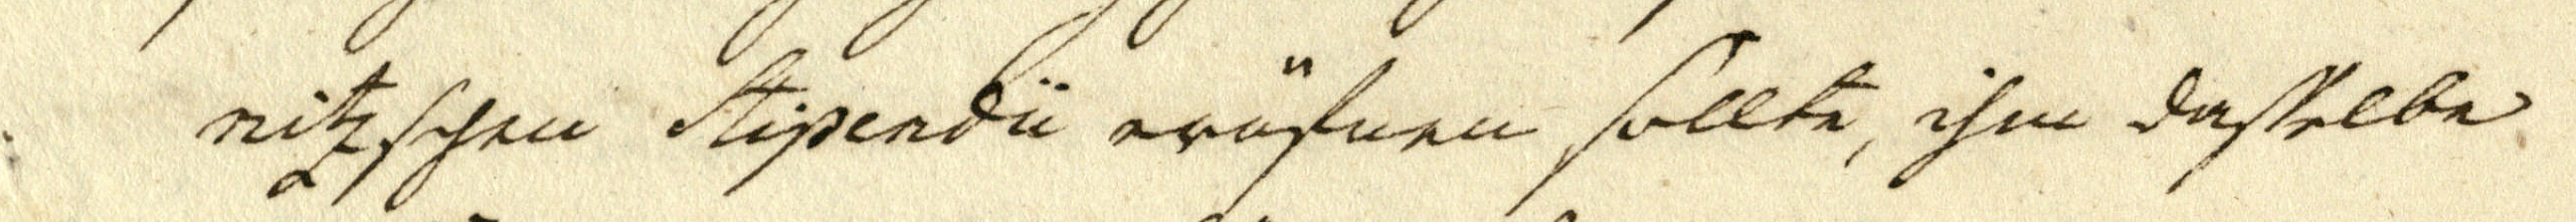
nitzschen Stipendii eröfnen sollte, ihm dasselbe
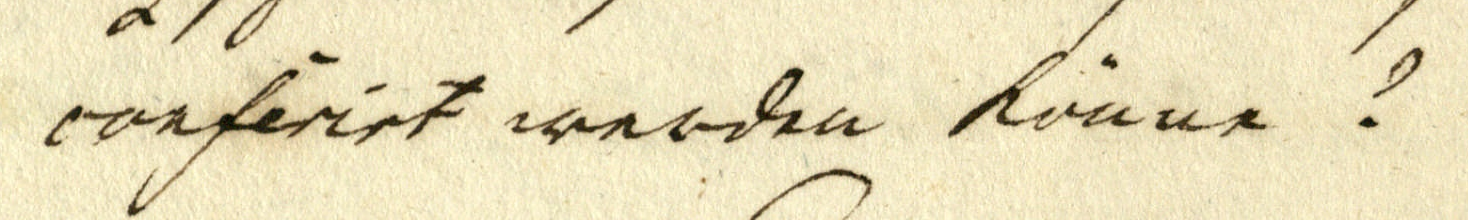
conferirt werden könne?
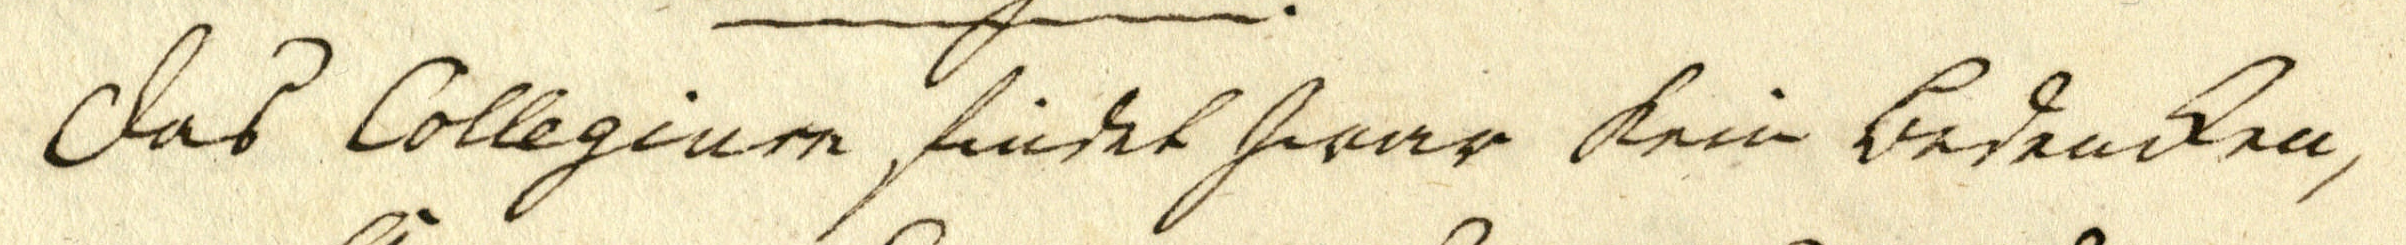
Das Collegium findet zwar kein Bedencken,
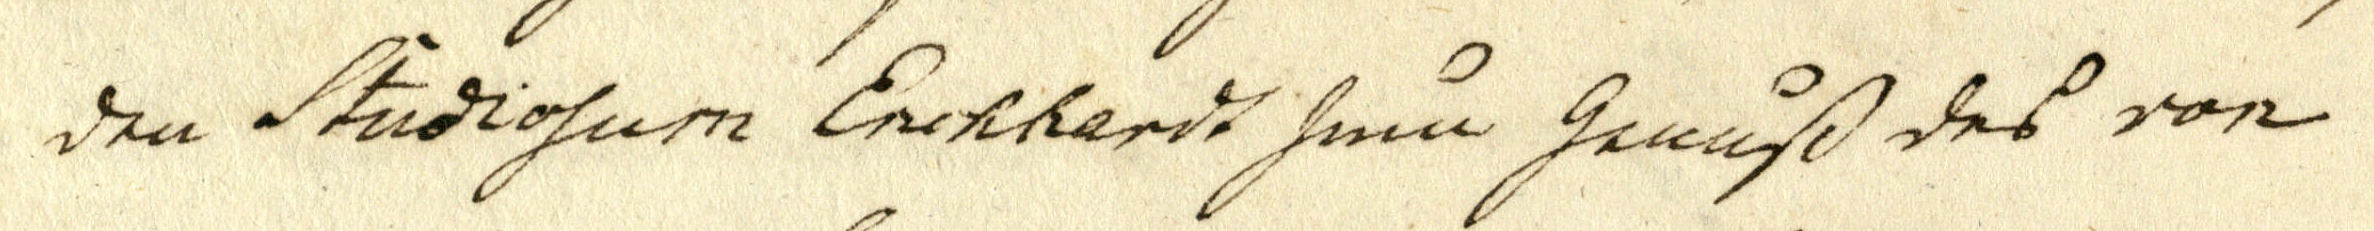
den Studiosum Enckhardt zum Genuß des von
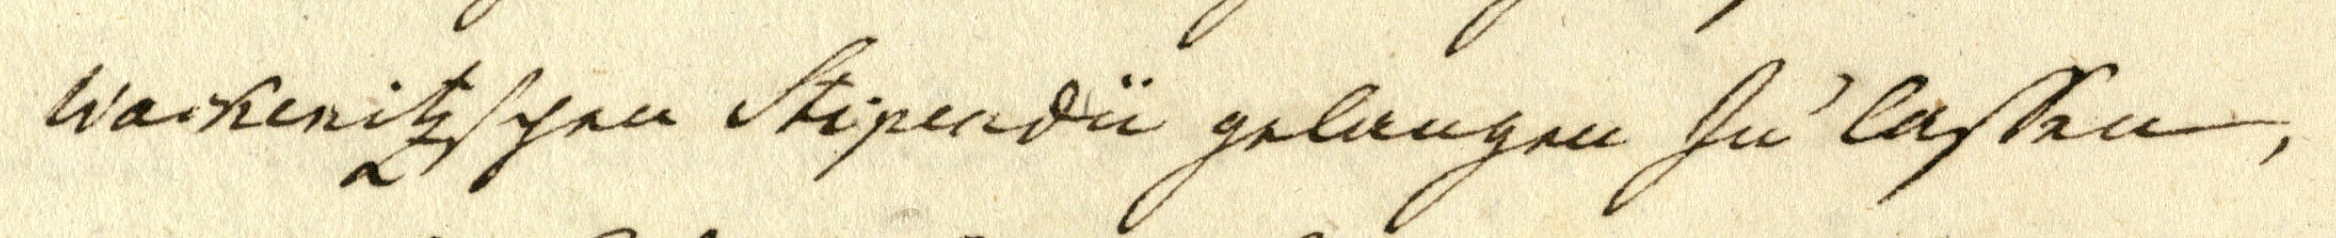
Wackenitzschen Stipendii gelangen zu lassen,
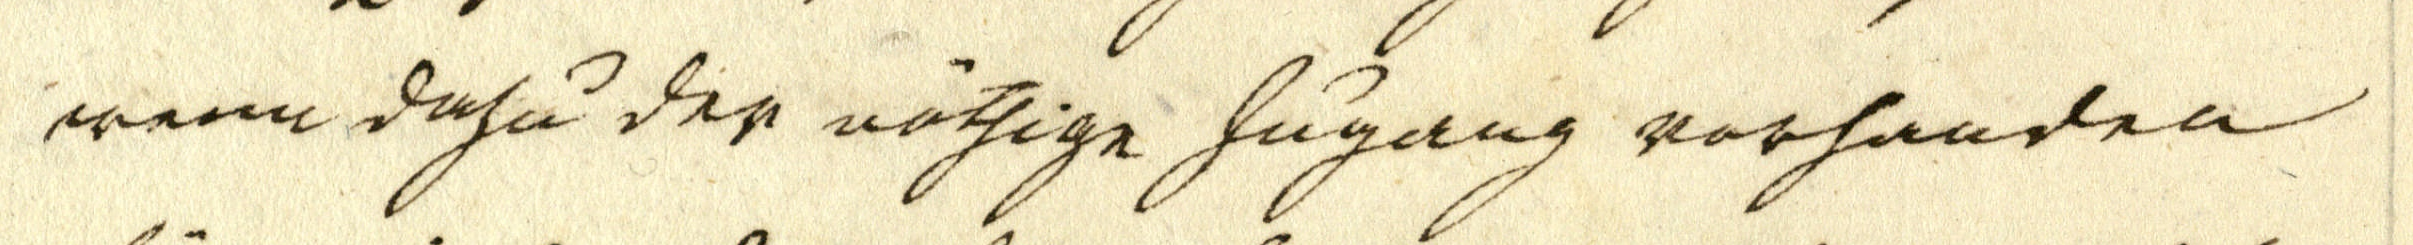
wenn dazu der nöthige Zugang vorhanden
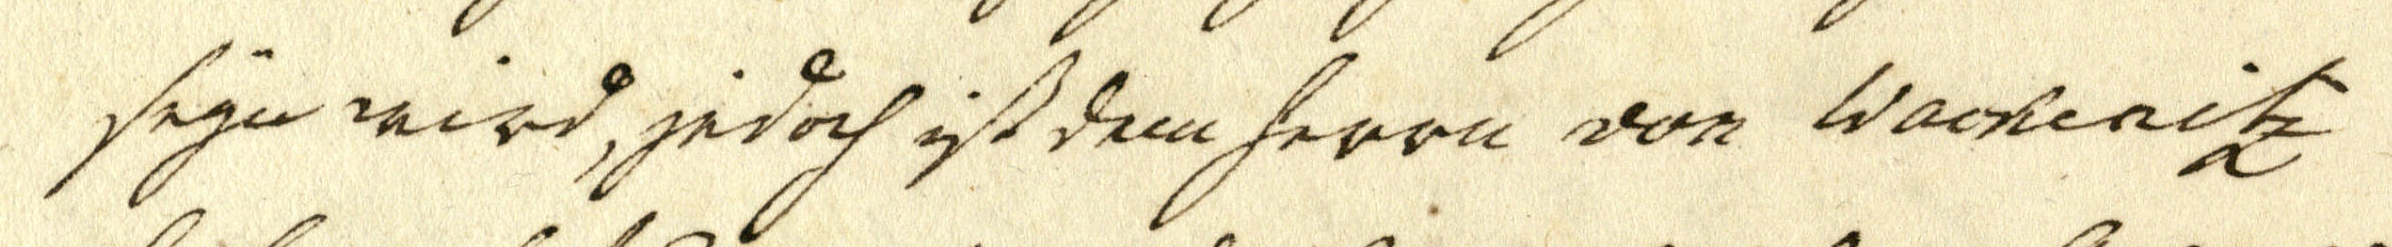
seÿn wird, jedoch ist dem herrn von Wackenitz
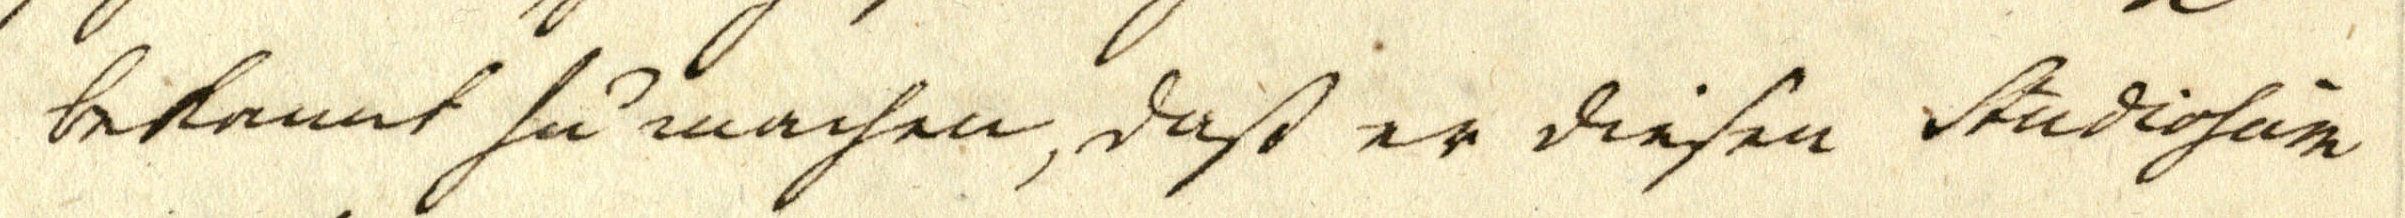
bekannt zu machen, daß der diesen Studiosum
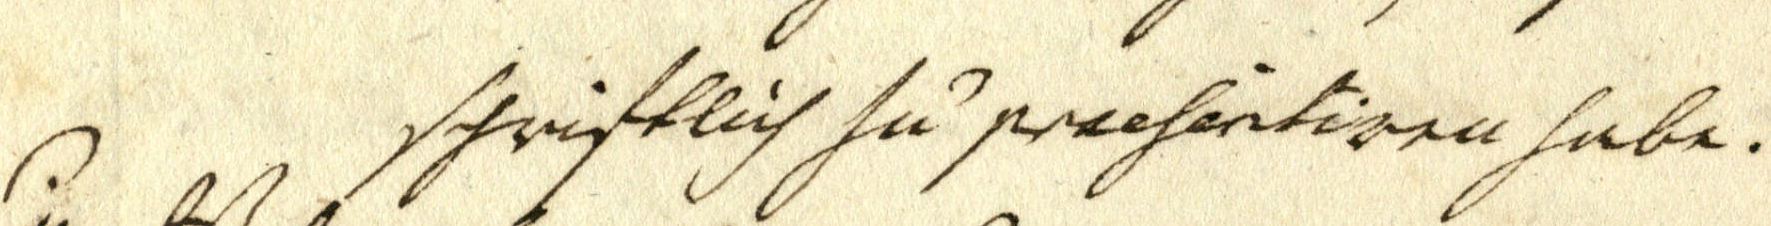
schriftlich zu praesentiren habe.
